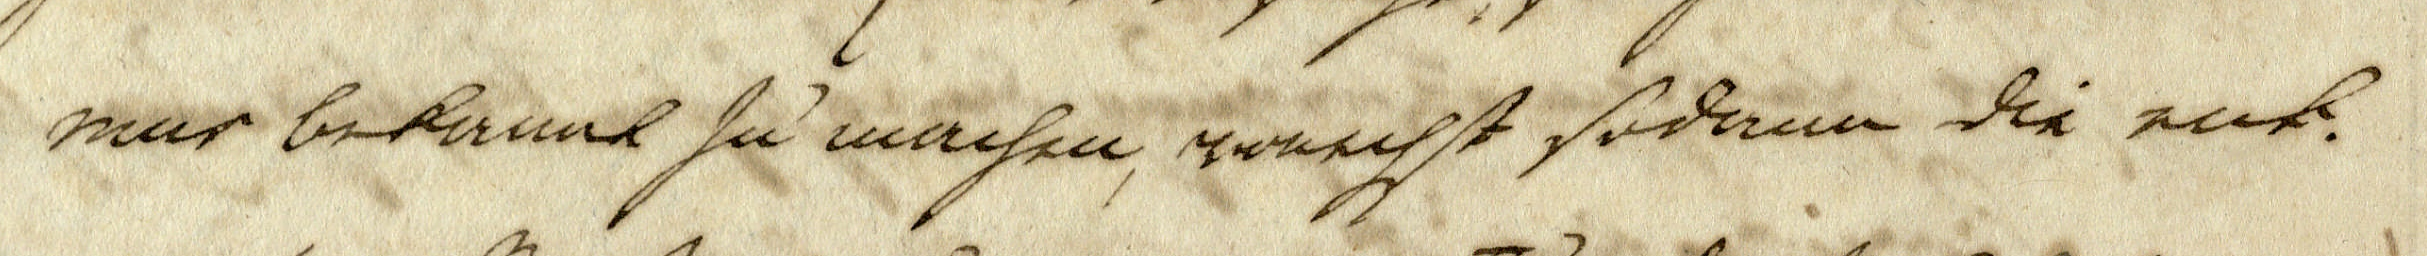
mus bekannt zu machen, wonechst sodann die ent¬
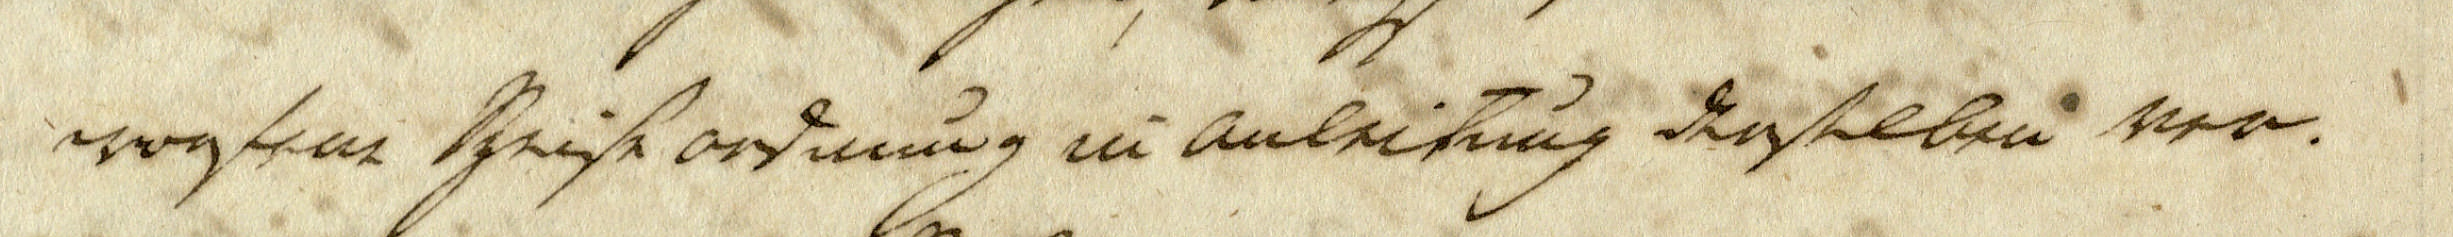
worfene Speiseordnung in Anleitung derselben ver¬
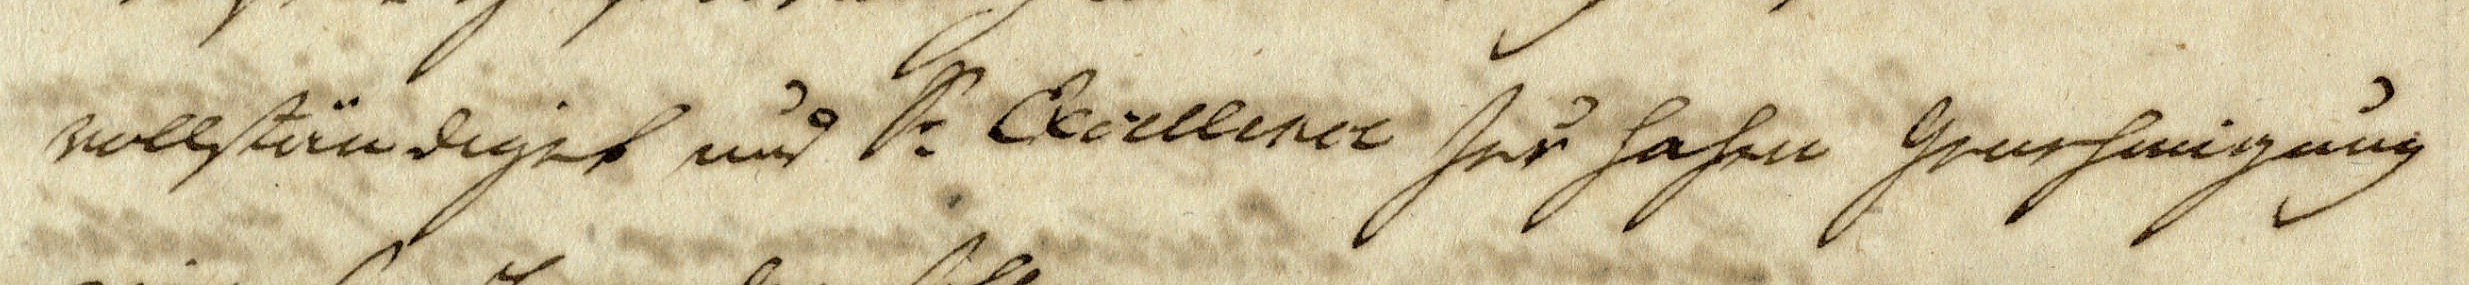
vollständiget und Sr. Excellence zur hohen Genehmigung
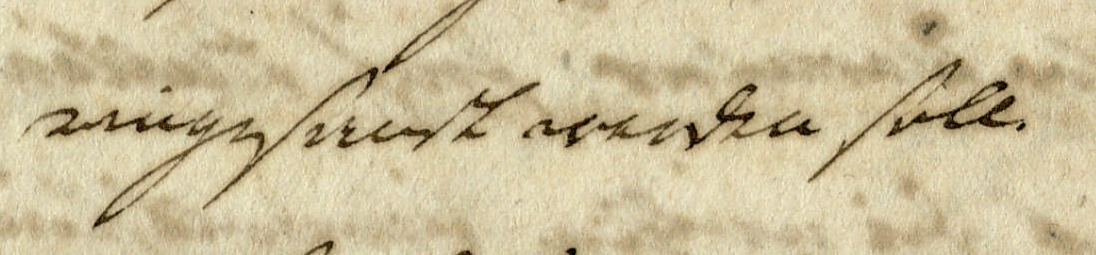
eingesandt werden soll.
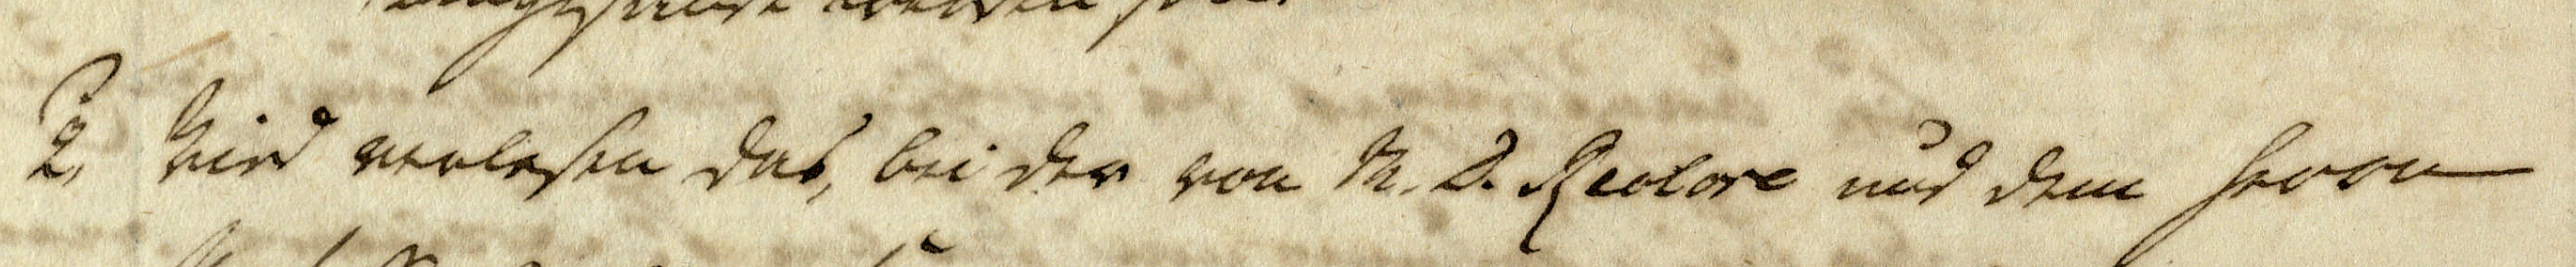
2. Wird verlesen das, bei der von M. D. Rectore und dem Herrn
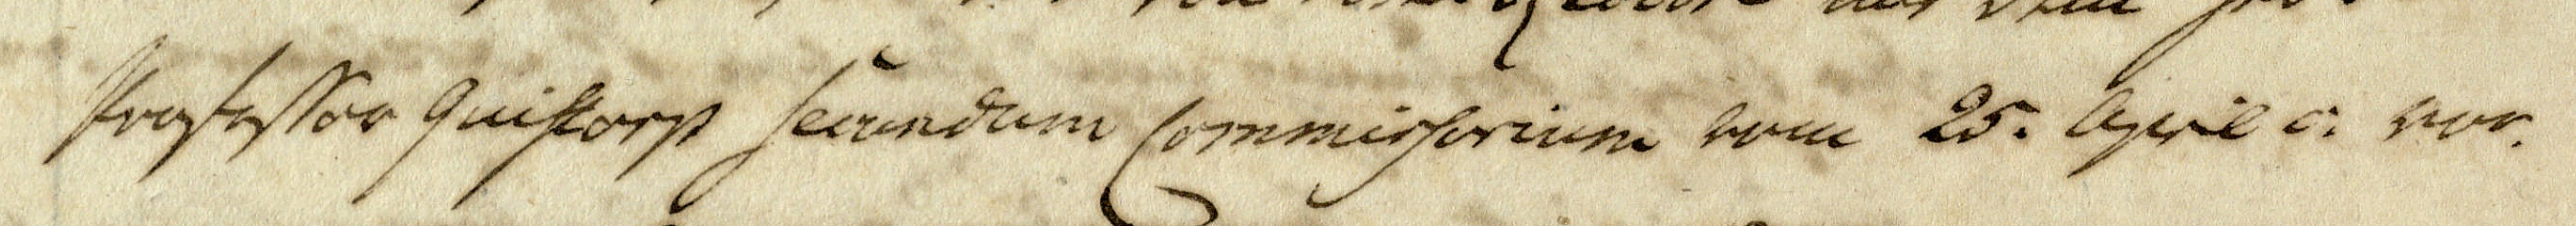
Professor Quistorp secundum Commissorium vom 25. April c. vor¬
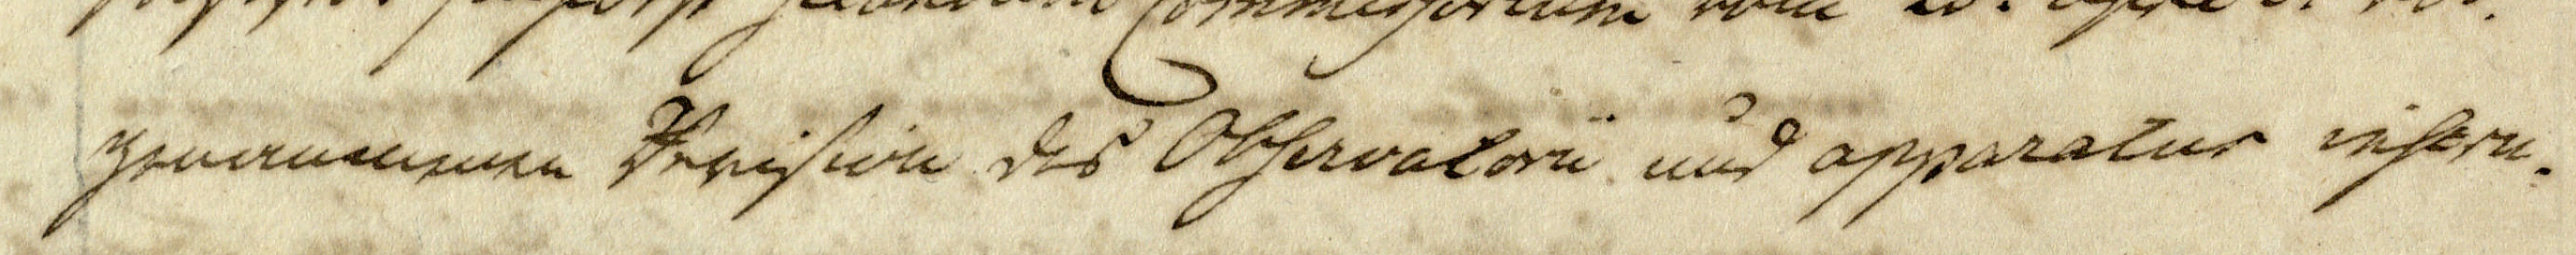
genommenen Revision des Observatorii und apparatus instru¬
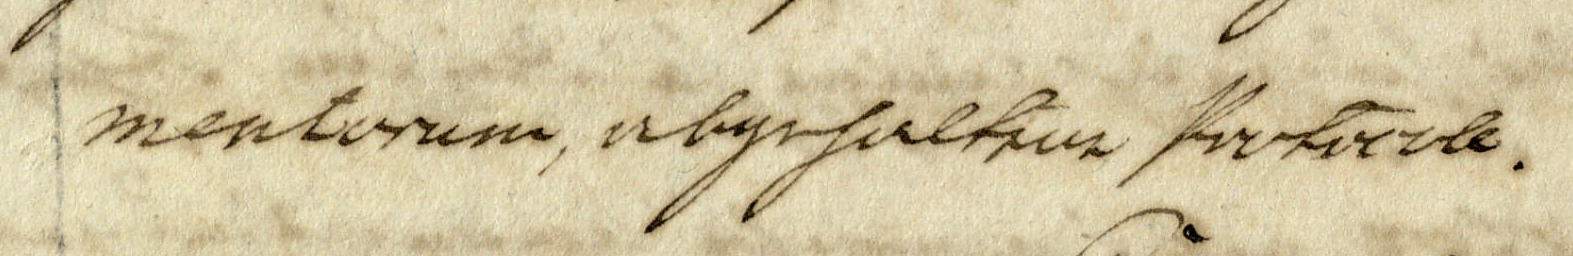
mentorum, abgehaltene Protocoll.
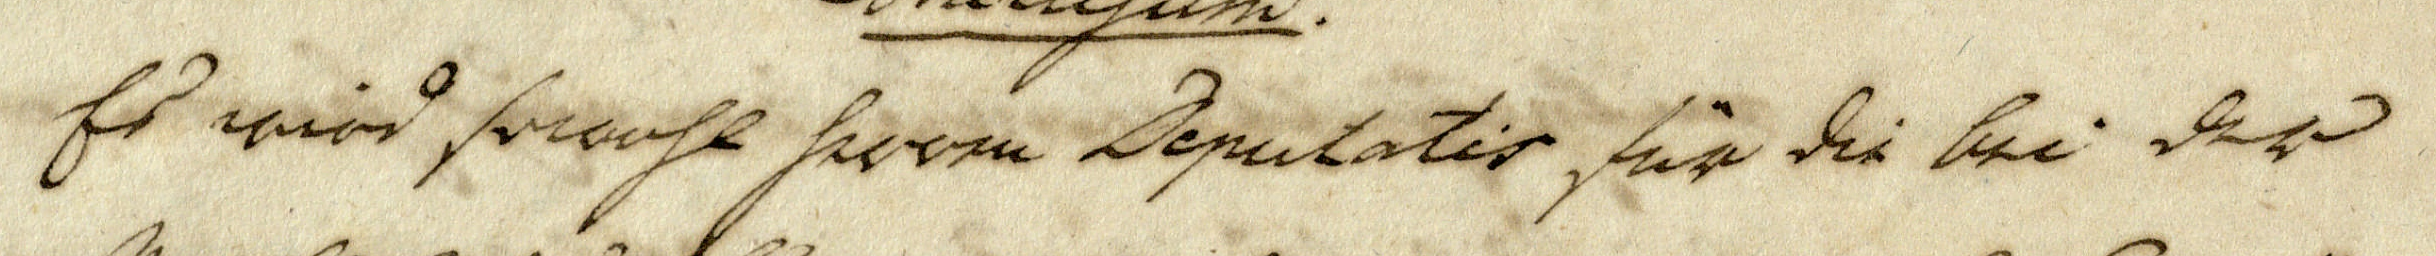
Es wird sowohl Herren Deputatis für die bei der
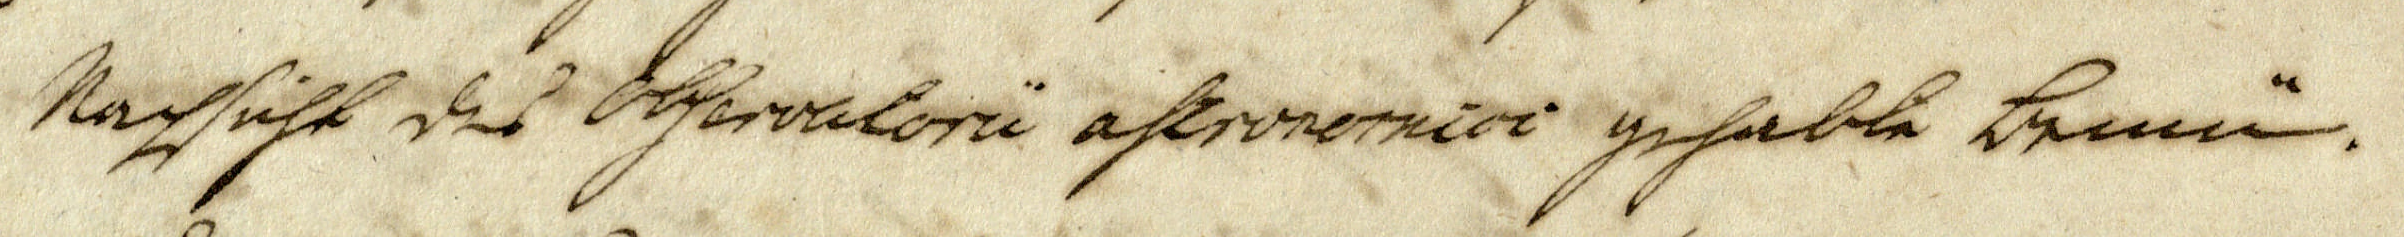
Nachsicht des Observatorii astronomici gehabte Bemü¬
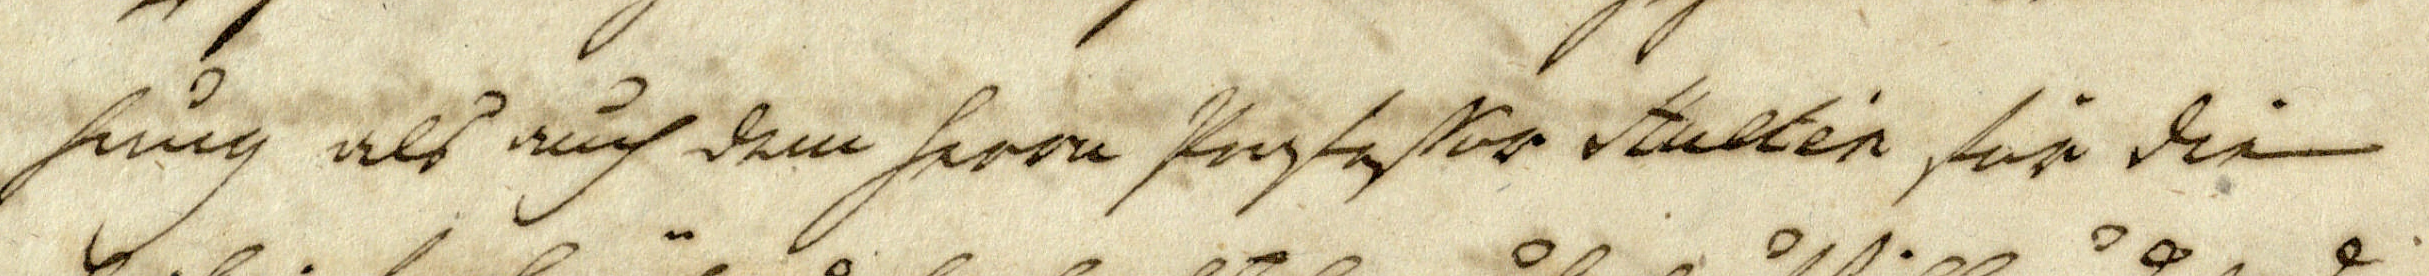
hung als auch dem Herrn Professor Hultén für die
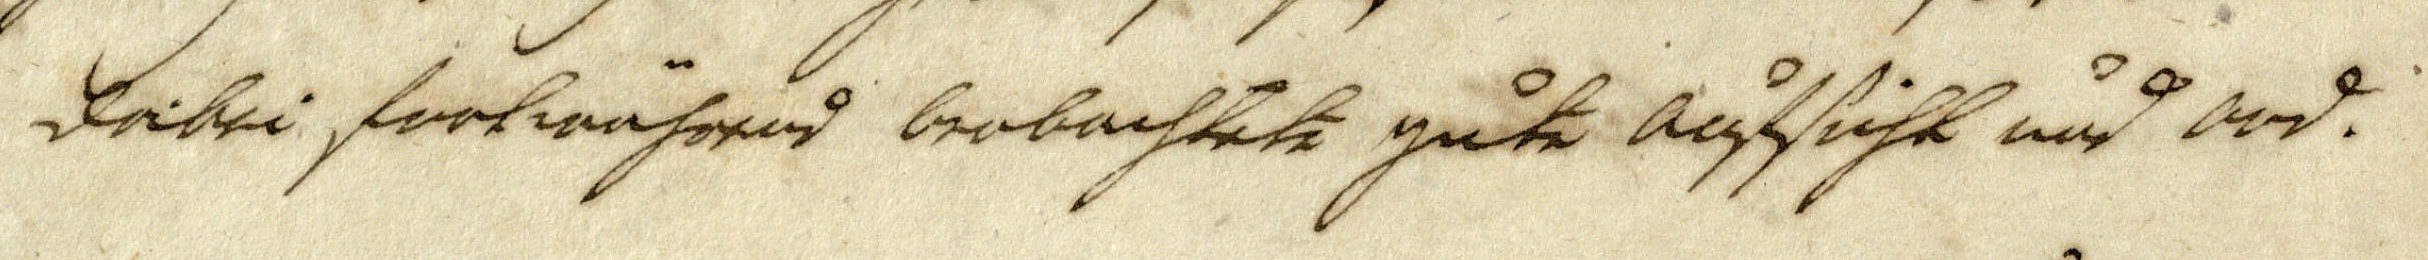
dabei fortwährend beobachtete gute Aufsicht und Ord¬
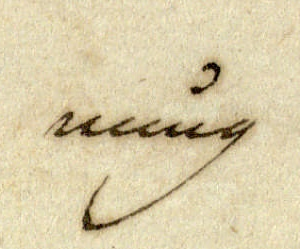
nung
